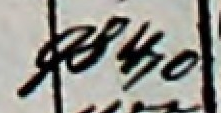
984,0
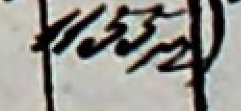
1155/2
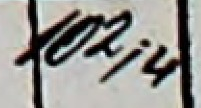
102,4
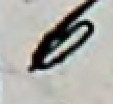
6
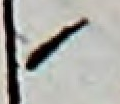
1
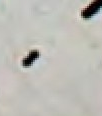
„
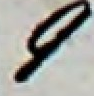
9
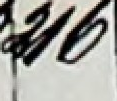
216
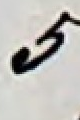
5
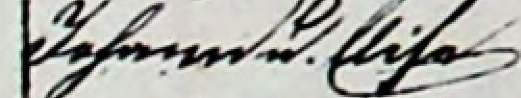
Johann u. Elise
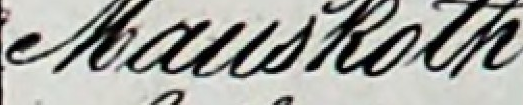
Muaskoth
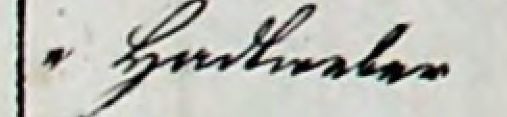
v Hadtweber
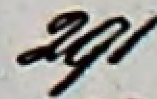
291
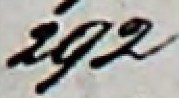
292
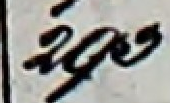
293
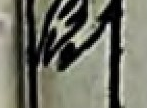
135
